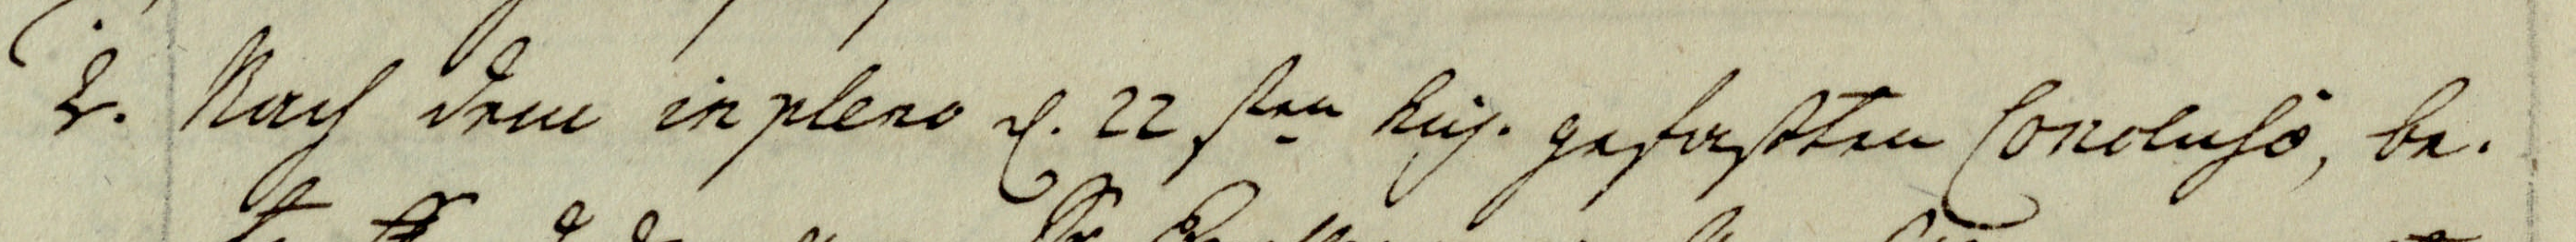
2. Nach dem in pleno d. 22 sten huj. gefaßten Concluso, be¬
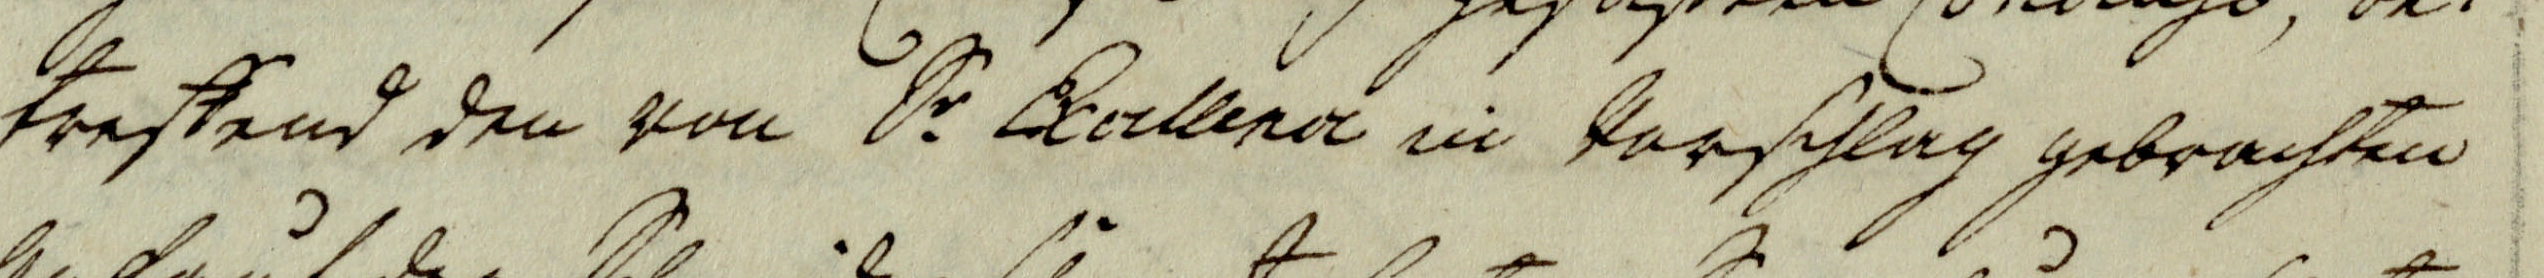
treffend den von Sr Excellence in Vorschlag gebrachten
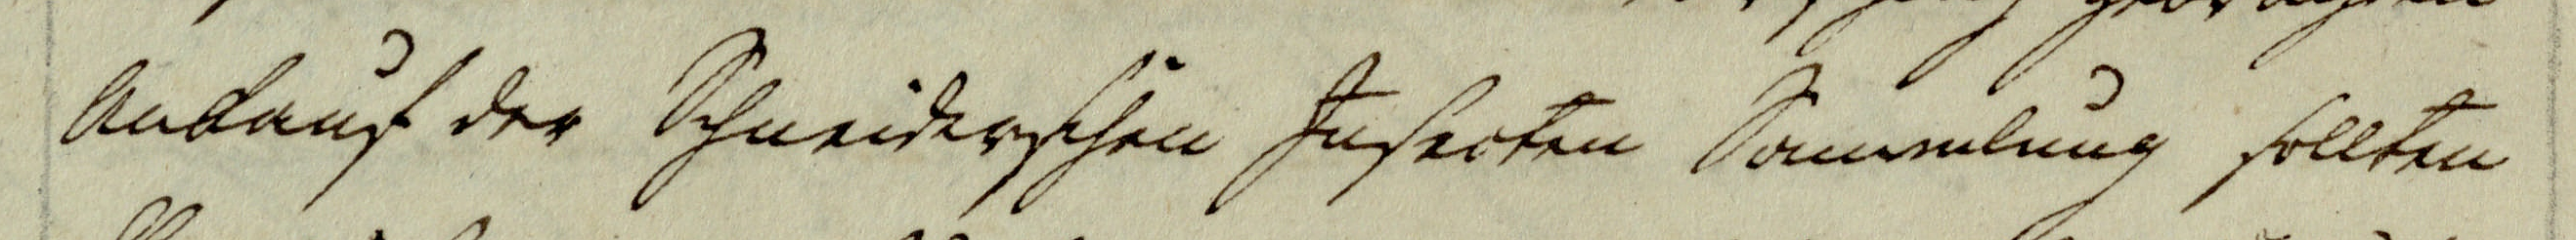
Ankauf der Schneiderschen Insecten Sammlung sollten
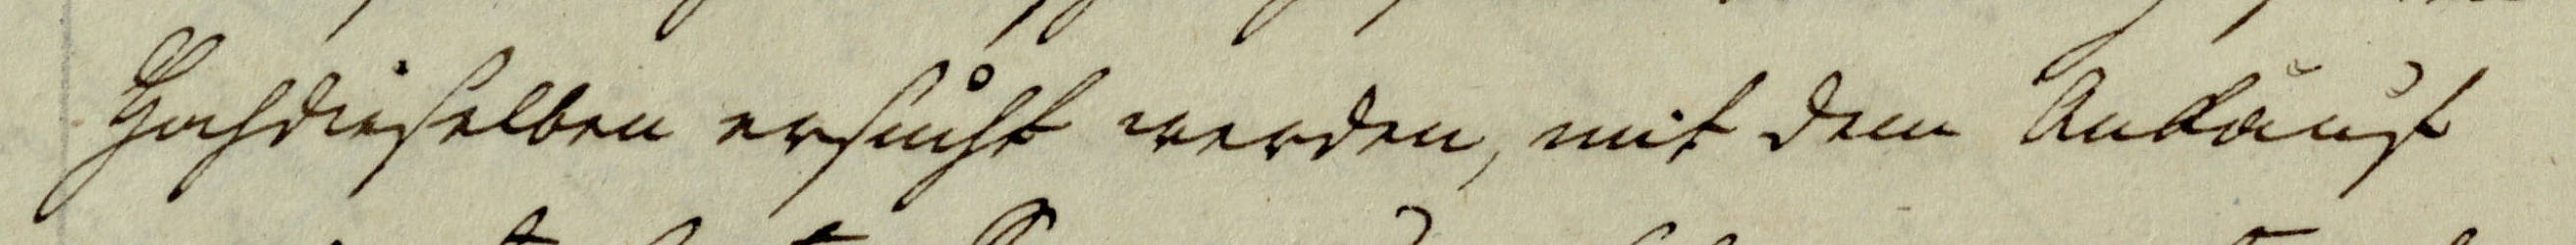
Hochdieselben ersucht werden, mit dem Ankauf
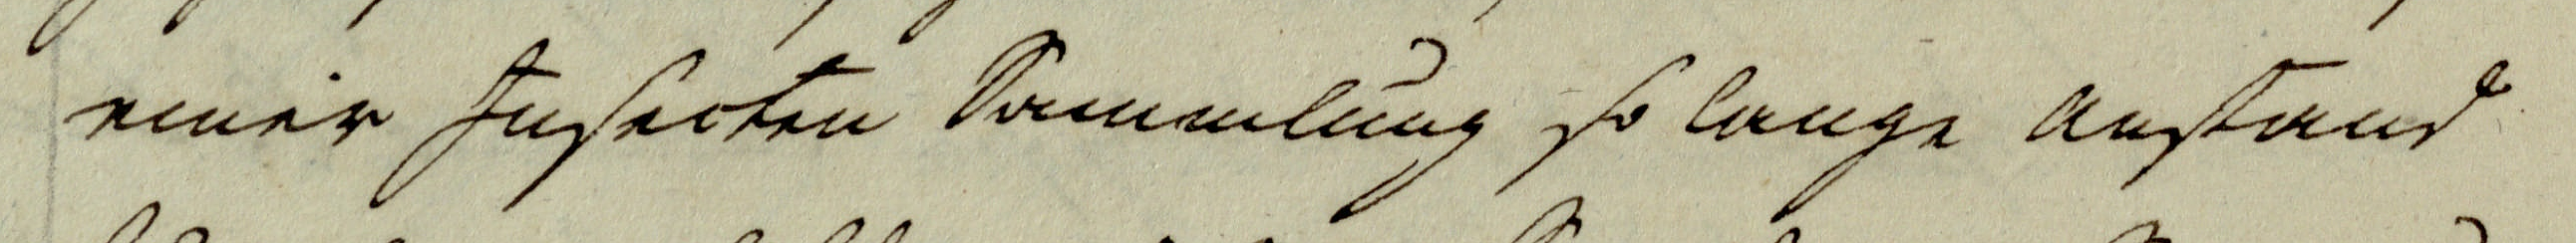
einer Insecten Sammlung so lange Anstand
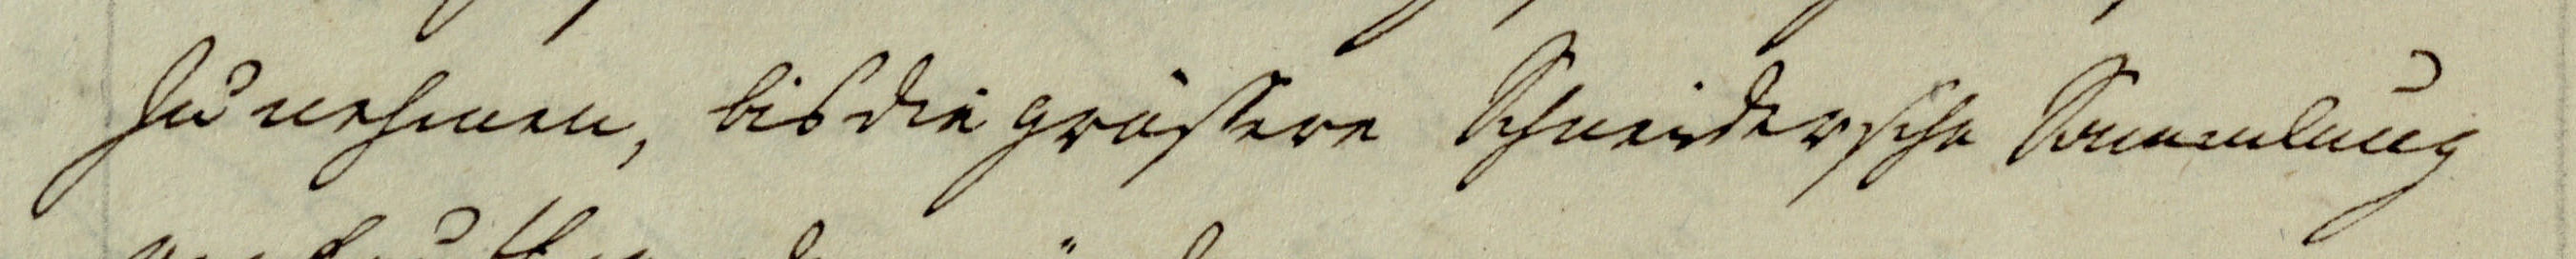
zu nehmen, bis die grössere Schneidersche Sammlung
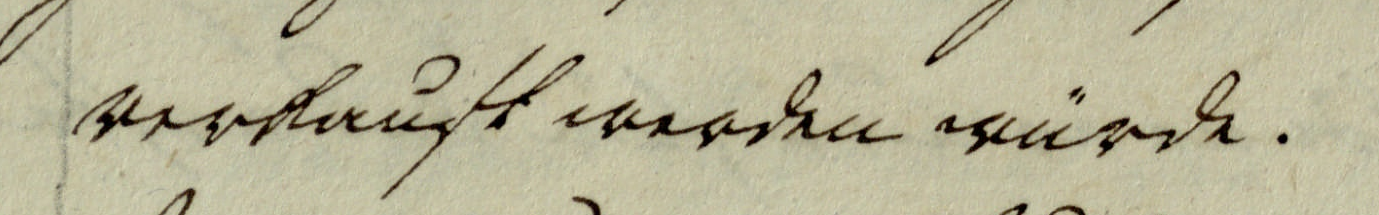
verkauft werden würde.
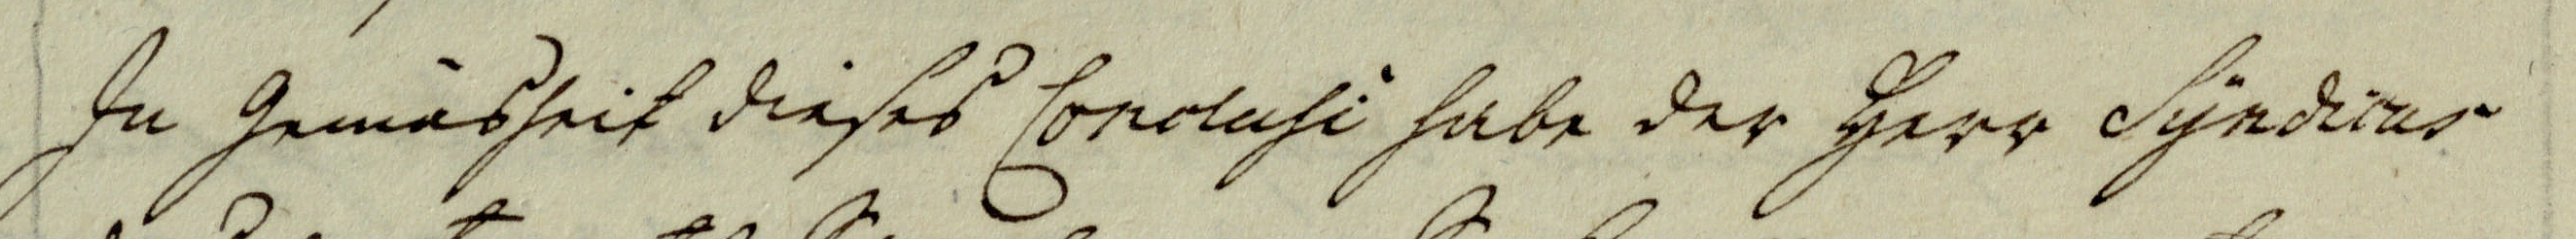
In Gemäsheit dieses Conclusi habe der Herr Sÿndicus
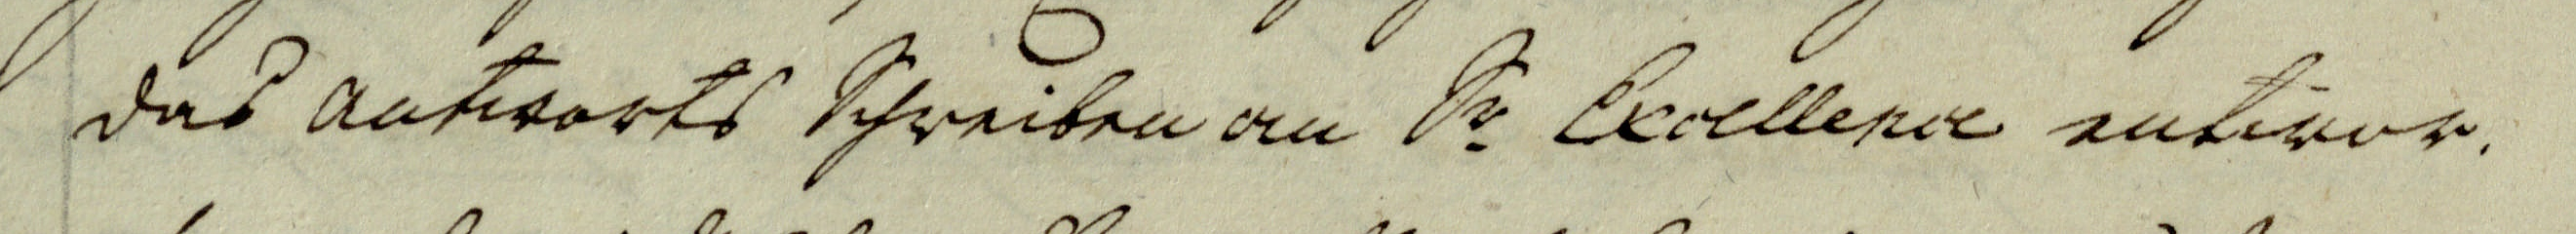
das Antworts Schreiben an Sr Excellence entwor¬
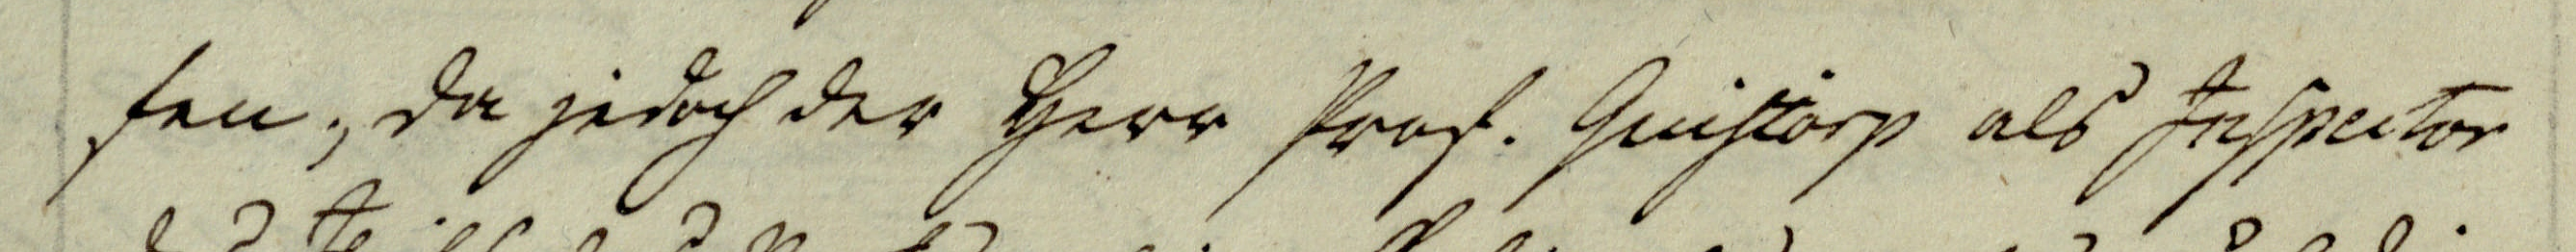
fen, da jedoch der Herr Prof. Quistorp als Inspector
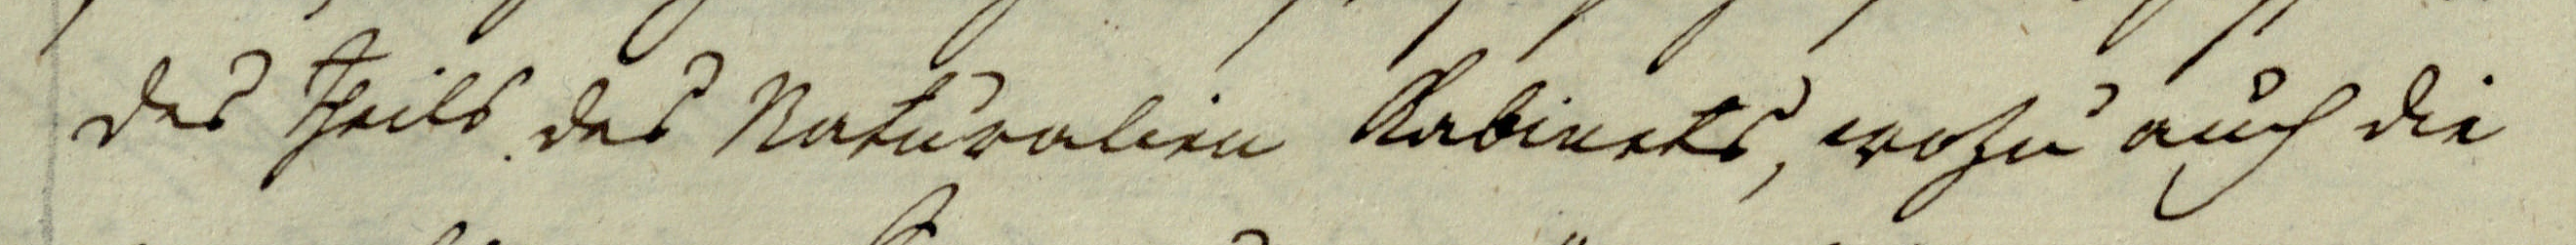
des Theils das Naturalien Kabinets, wozu auch die
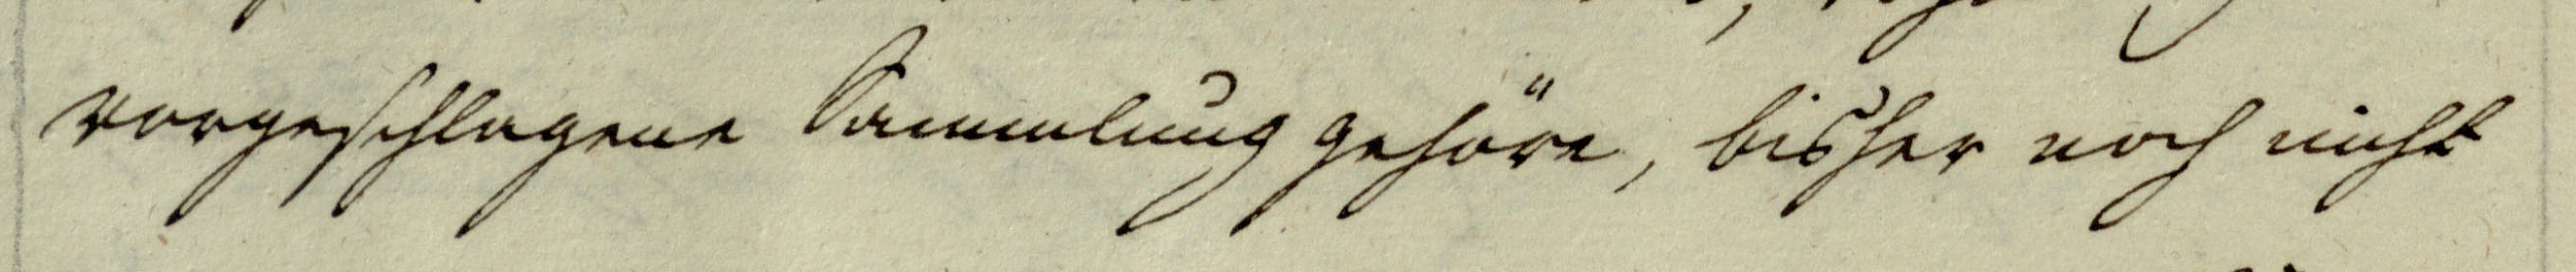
vorgeschlagene Sammlung gehöre, bisher noch nicht
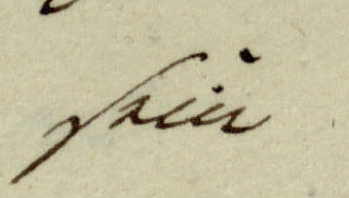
sein
